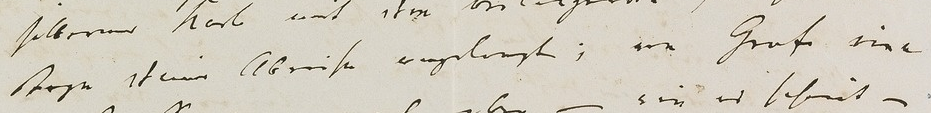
Tage deiner Abreise angelangt; von Graf eine
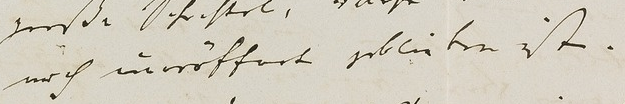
noch uneröffnet geblieben ist.
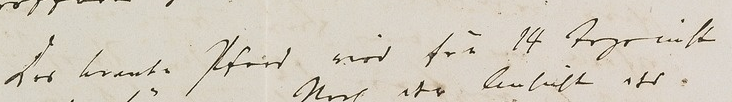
Das kranke Pferd wird für 14 Tage nicht
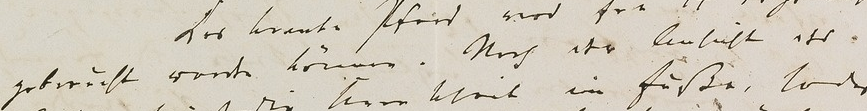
gebraucht werden können. Nach der Ansicht des
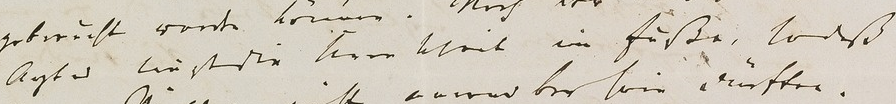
Arztes liegt die Krankheit im Fuße, so daß
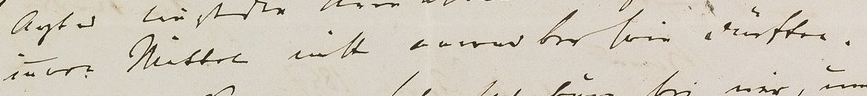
innere Mittel nicht anwendbar sein dürften.
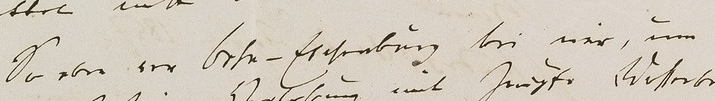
So eben war Behn-Eschenburg bei mir, um
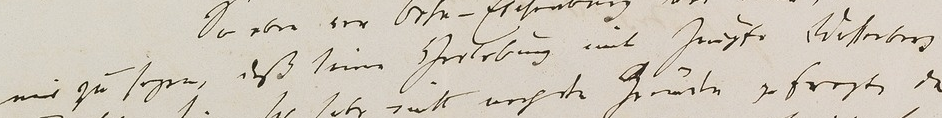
mir zu sagen, daß seine Verlobung mit Jungfer Wasserberg
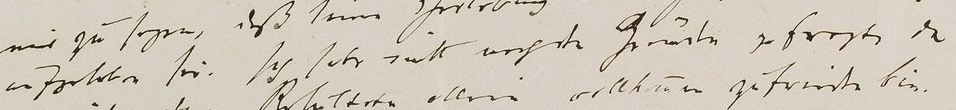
aufgehoben sei. Ich habe nicht nach den Gründen gefragt, da
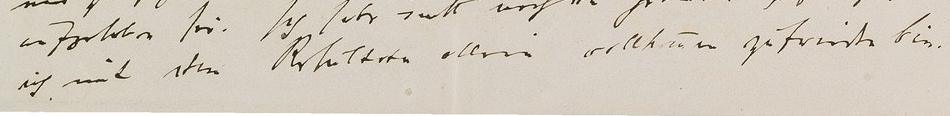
ich mit dem Resultate allein vollkommen zufrieden bin.
